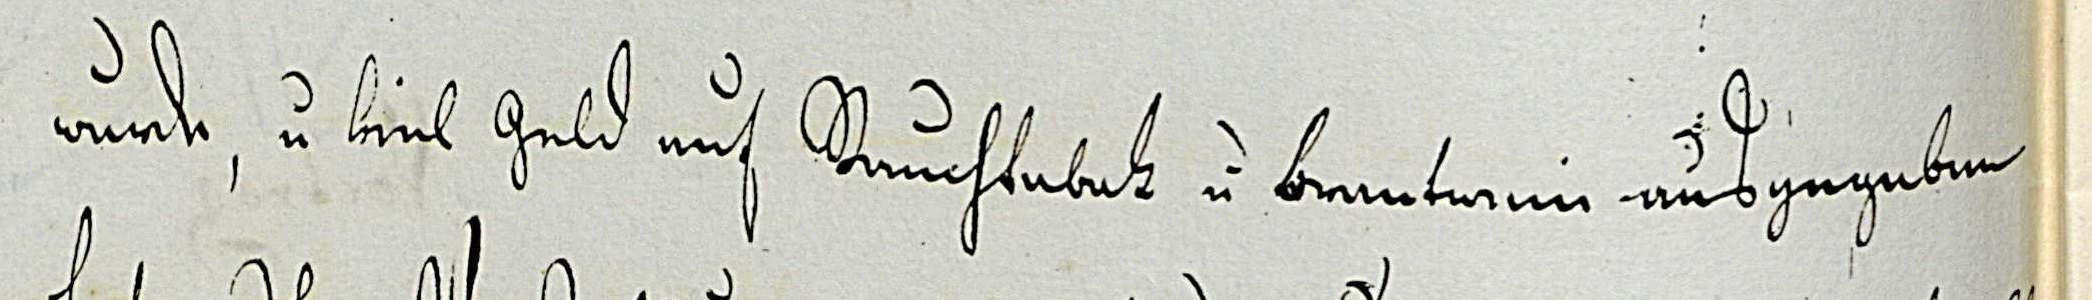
wurde, u. lies Geld auf Rauchtabak u. Branntwein ausgegeben
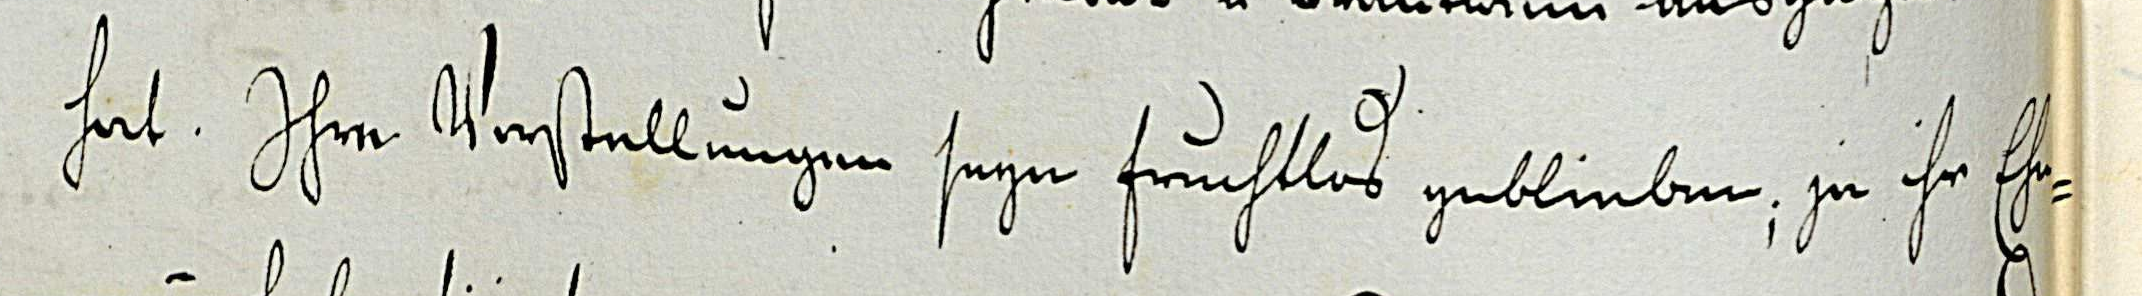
hat. Ihre Vorstellungen seyn fruchtlos geblieben; ja ihr Ehe¬
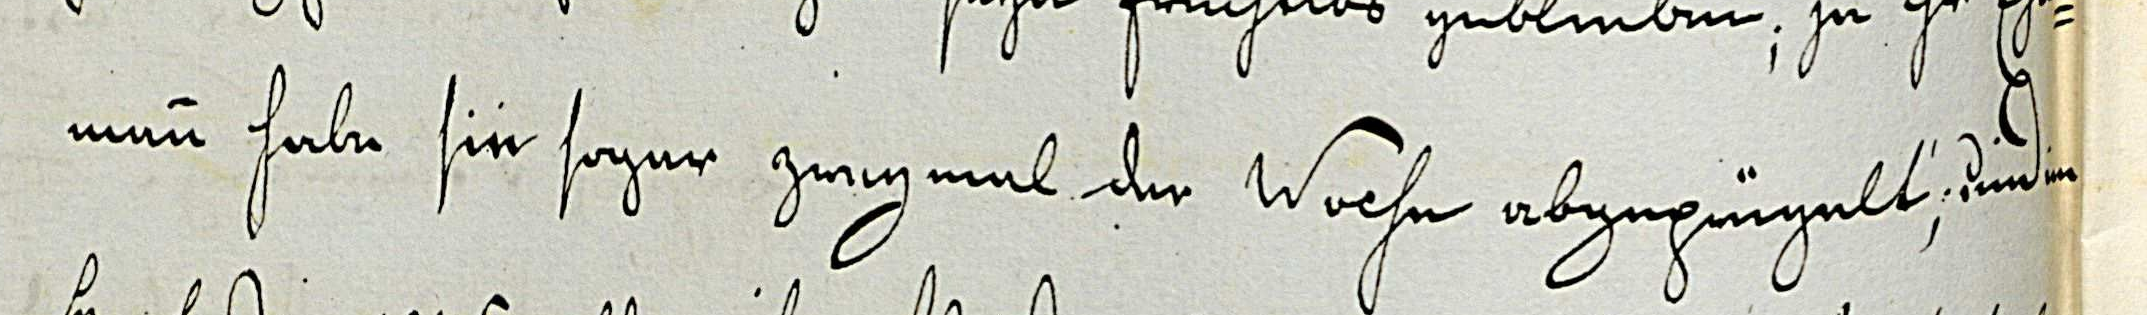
mann habe sie sogar zweymal der Woche abgeprügelt, und in
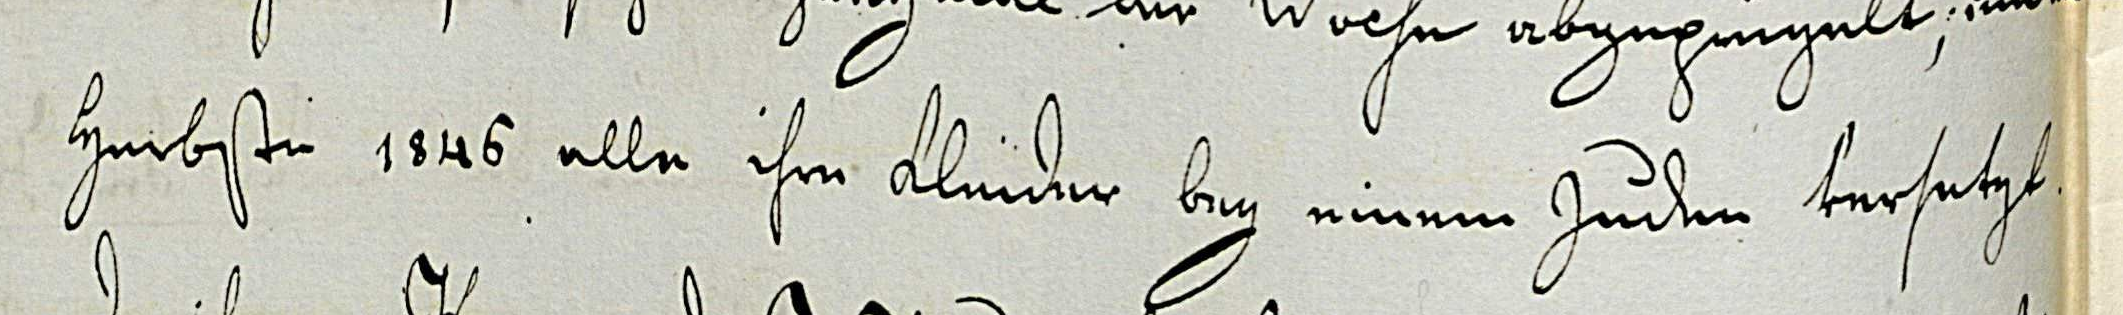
Herbste 1846 alle ihre Kleider bey einem Juden versetzt.
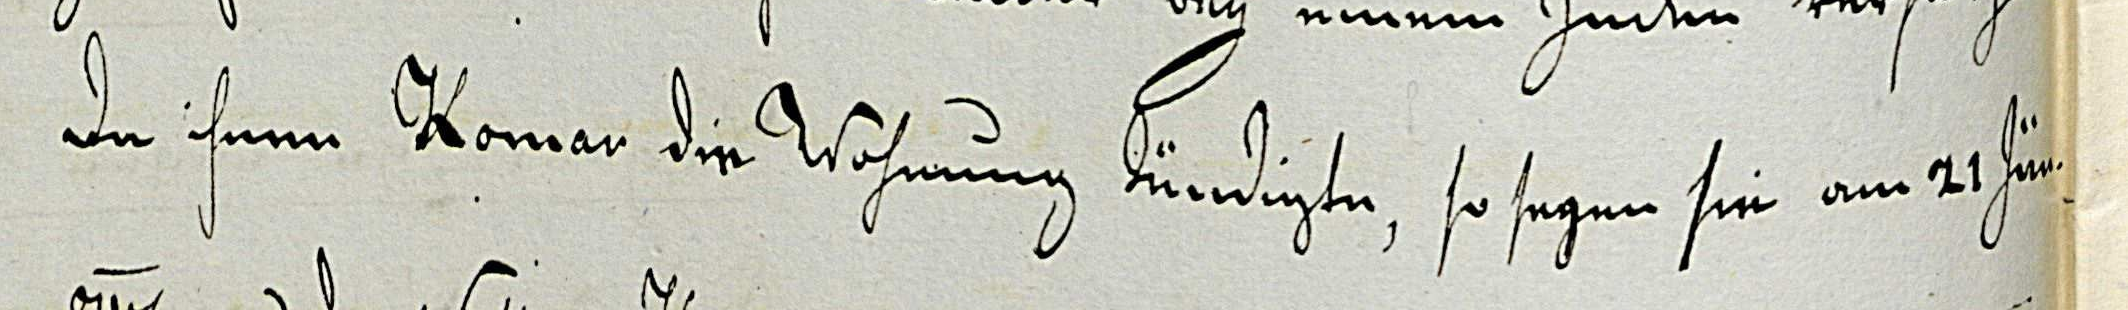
Da ihnen Komar die Wohnung kündigte, so segen sie am 32. Jän.
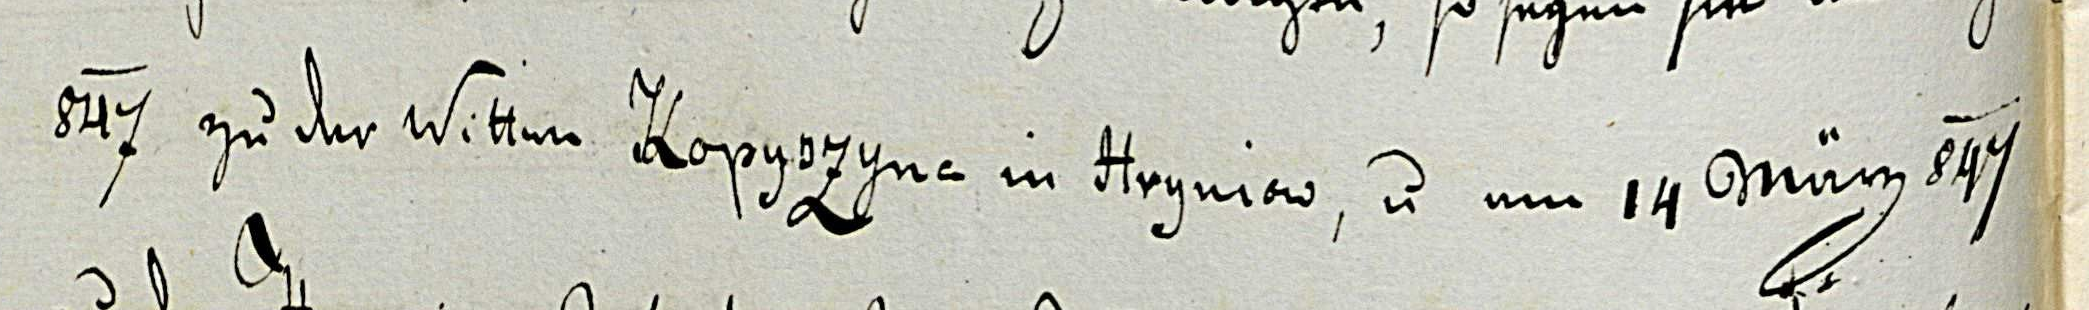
847 zu der Wittwe Kopyszyna in Hryniow, u. am 14. März 847
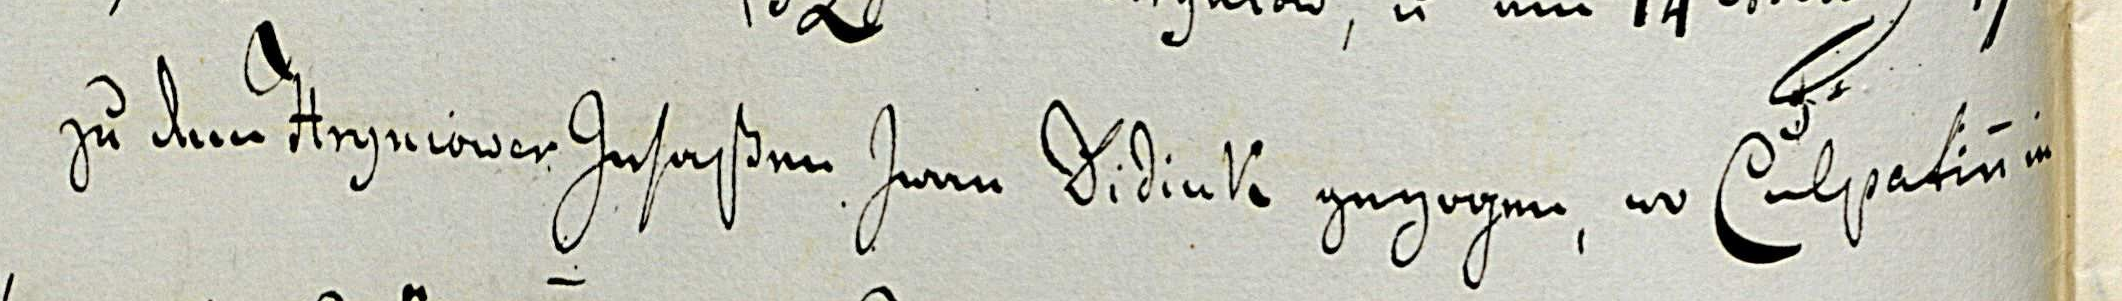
zu dem Hryniower Insaßen Ivan Didiuk gezogen, wo Culpatiu in
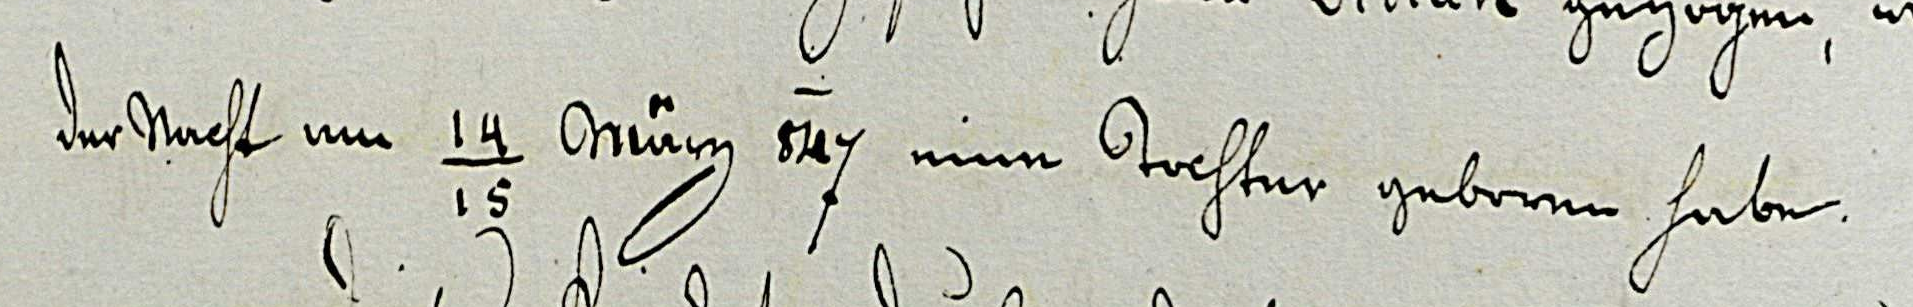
der Nacht am 14/15 März 847 eine Tochter geboren habe.
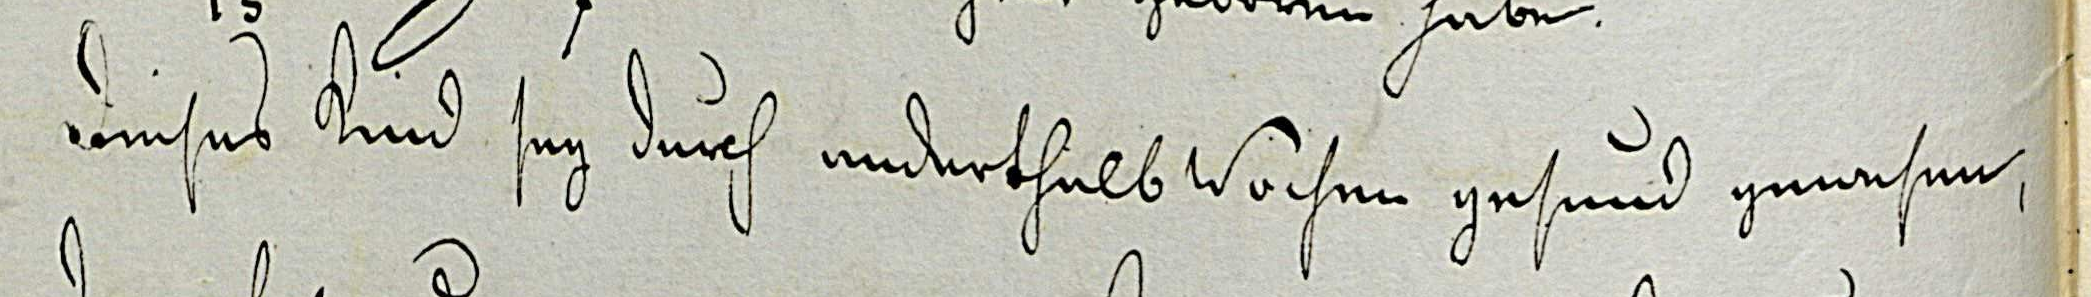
Dieses Kind sey durch anderthalb Wochen gesund gewesen,
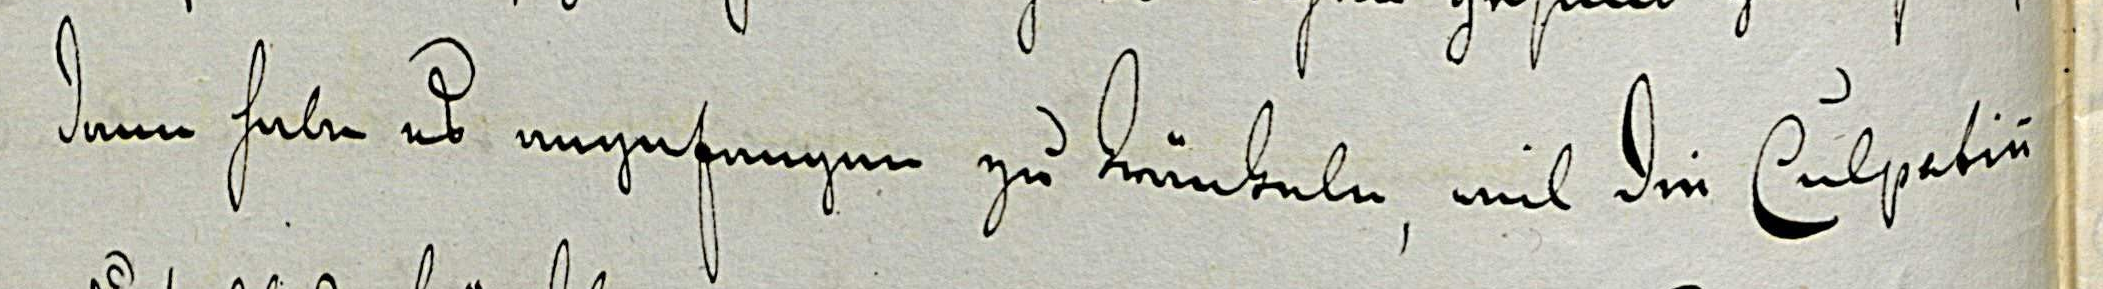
dann habe es angefangen zu kränkeln, weil die Culpatiu
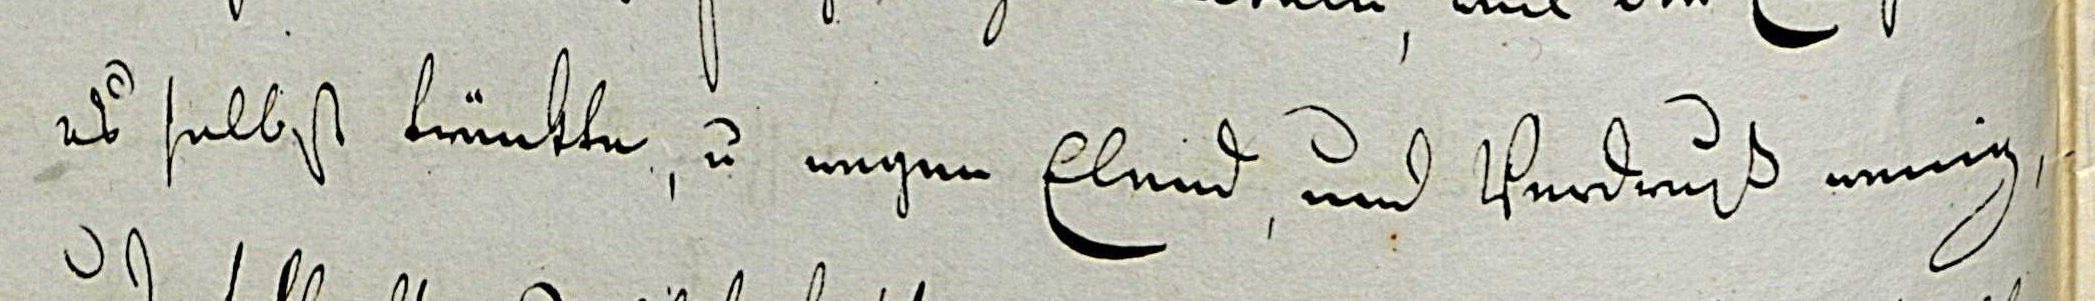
es selbst tränkte [suckle], u wegen Elend und Verdruß wenig
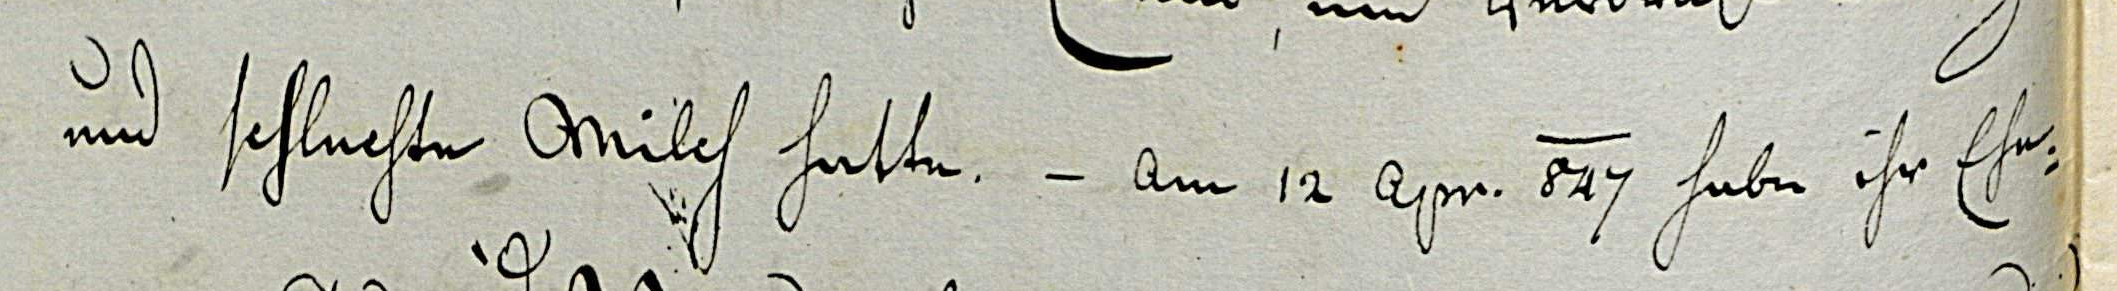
und schlechte Milch hatte. Am 12 Apr 847 habe ihr Ehe¬
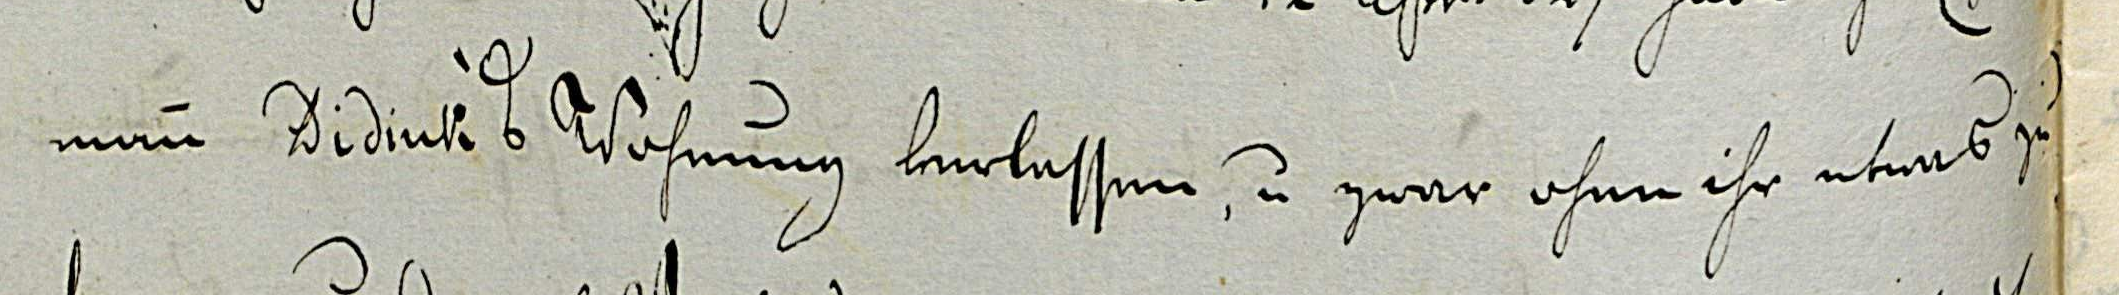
mann Didiuk’s Wohnung verlassen u. zwar ohne ihr etwas zu
